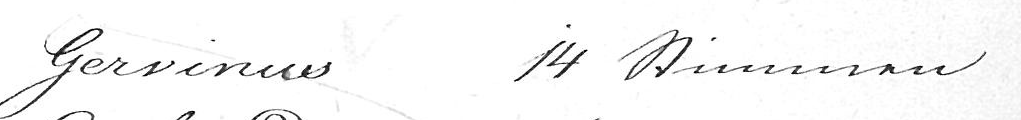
Gervinus 14 Stimmen
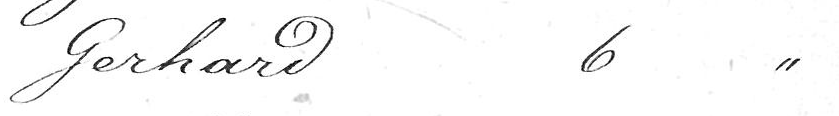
Gerhard 6 "
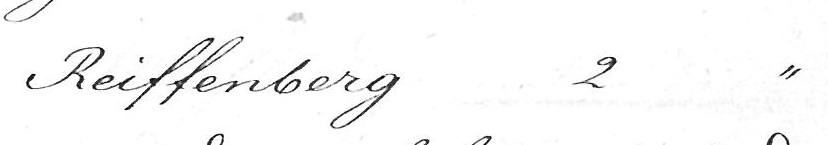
Reiffenberg 2 "
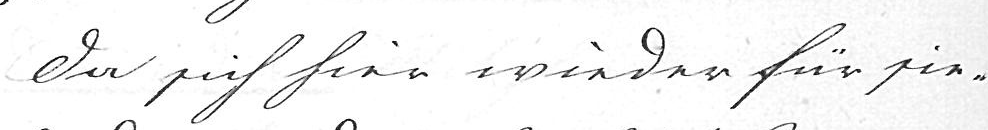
Da sich hier wieder für sie-
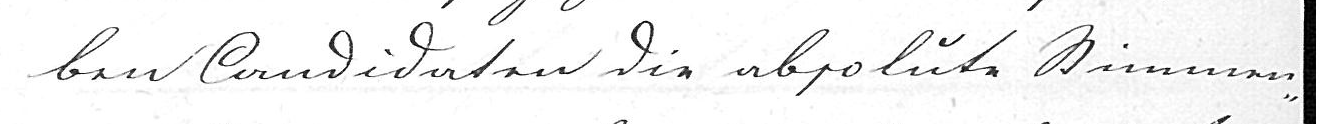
ben Candidaten die absolute Stimmen-
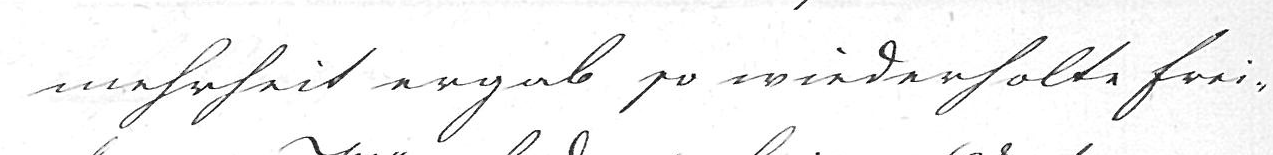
mehrheit ergab so wiederholten Frei-
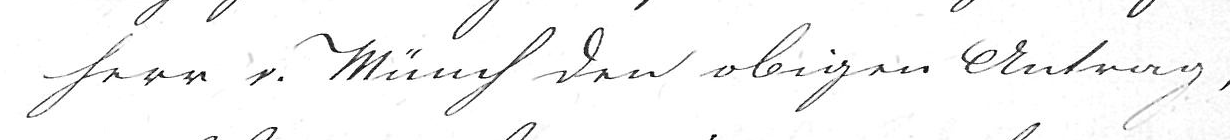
herr v. Münch den obigen Antrag,
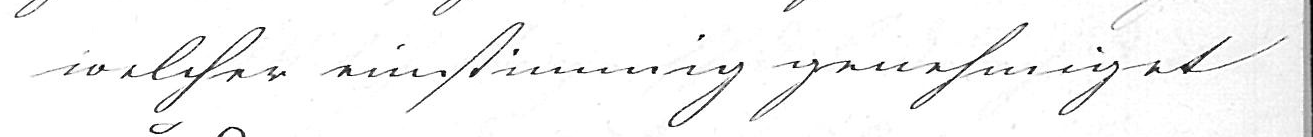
welcher einstimmig genehmiget
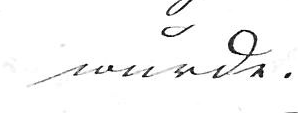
wurde.
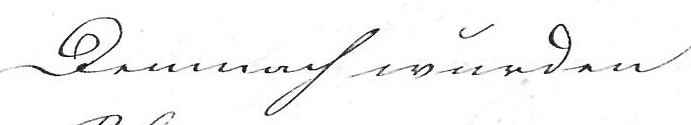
Demnach wurden
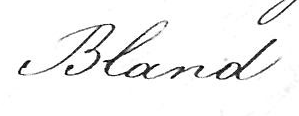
Bland
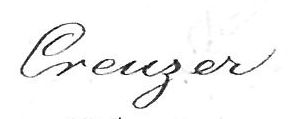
Creuzer
